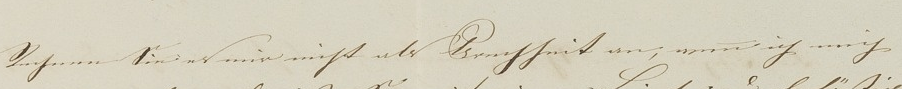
Rechnen Sie es mir nicht als Frechheit an, wenn ich mich
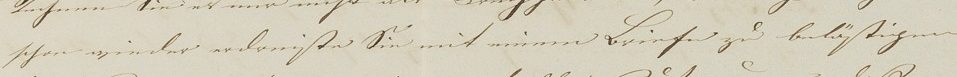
schon wieder erdreiste Sie mit einem Briefe zu belästigen,
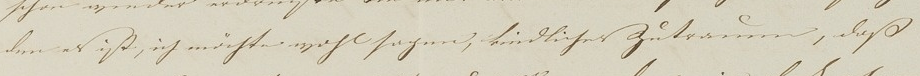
den es ist, ich möchte wohl sagen, kindliches Zutrauen, daß
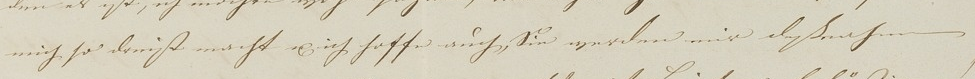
mich so dreist macht & ich hoffe auch, Sie werden mir deßnahen
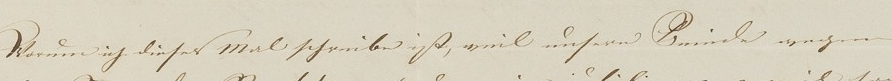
Warum ich dieses Mal schreibe ist, weil unsere Feinde wegen
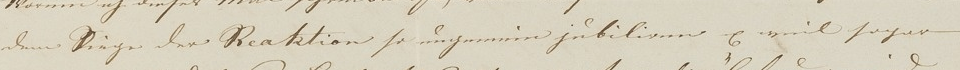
dem Siege der Reaktion so ungemein jubiliren & weil sogar
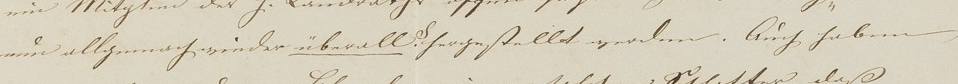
nun allgemach wieder überall? hergestellt werden. Auch haben
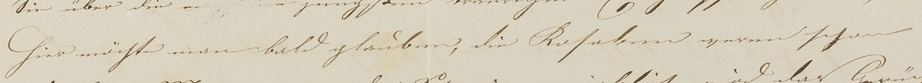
hier möchte man bald glauben, die Kosaken weren schon
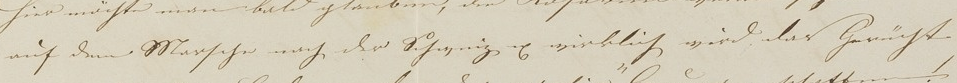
auf dem Marsche nach der Schweiz & wirklich wird das Gerücht
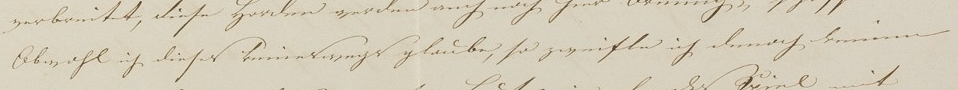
Obwohl ich dieses keineswegs glaube, so zweifle ich denoch keinen
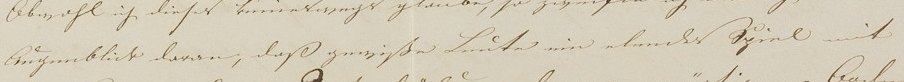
Augenblick daran, daß gewiße Leute ein elendes Spiel mit
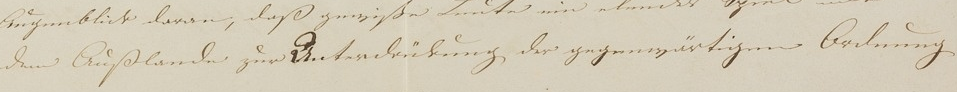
dem Außlande zur Unterdrückung der gegenwärtigen Ordnung
